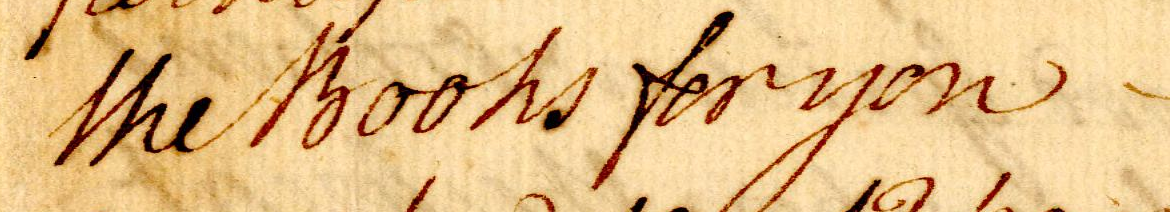the Books for you.
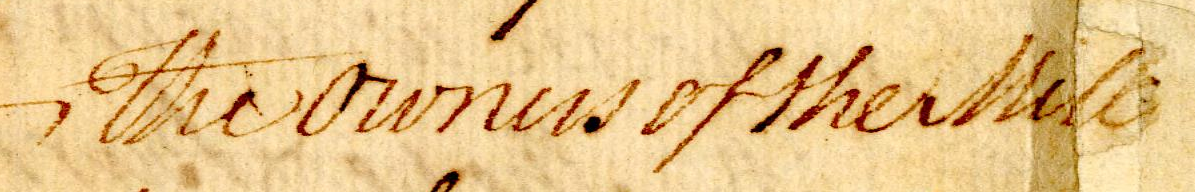The owners of the Mill
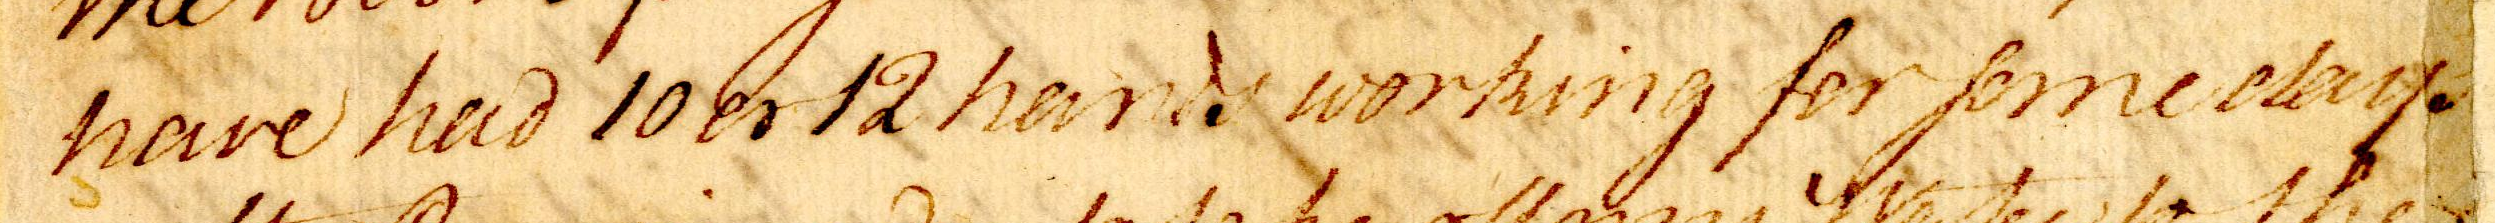have had 10 or 12 hands working for someday
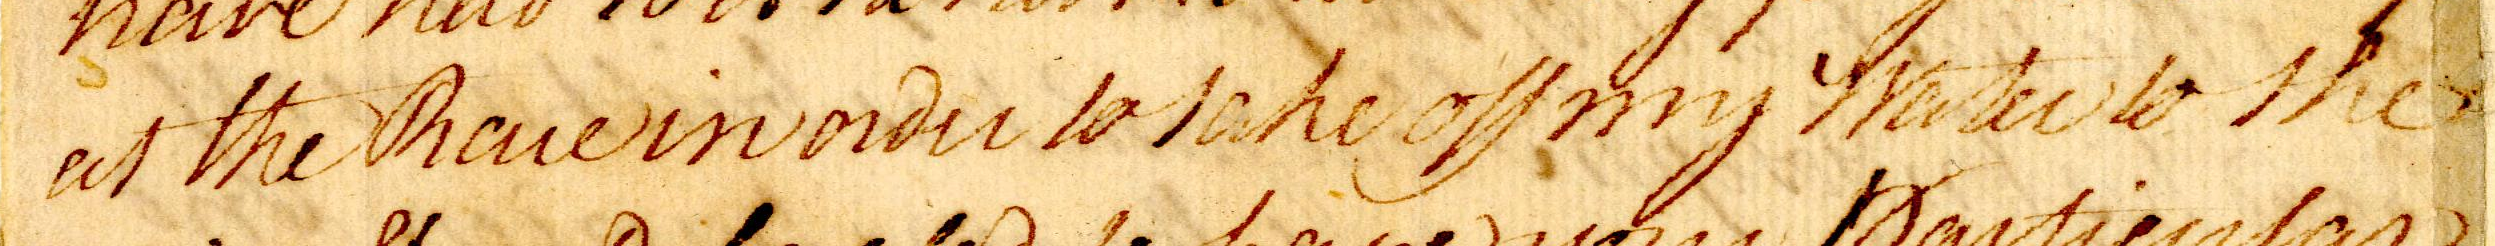at the Raie in order to take off my Water to the
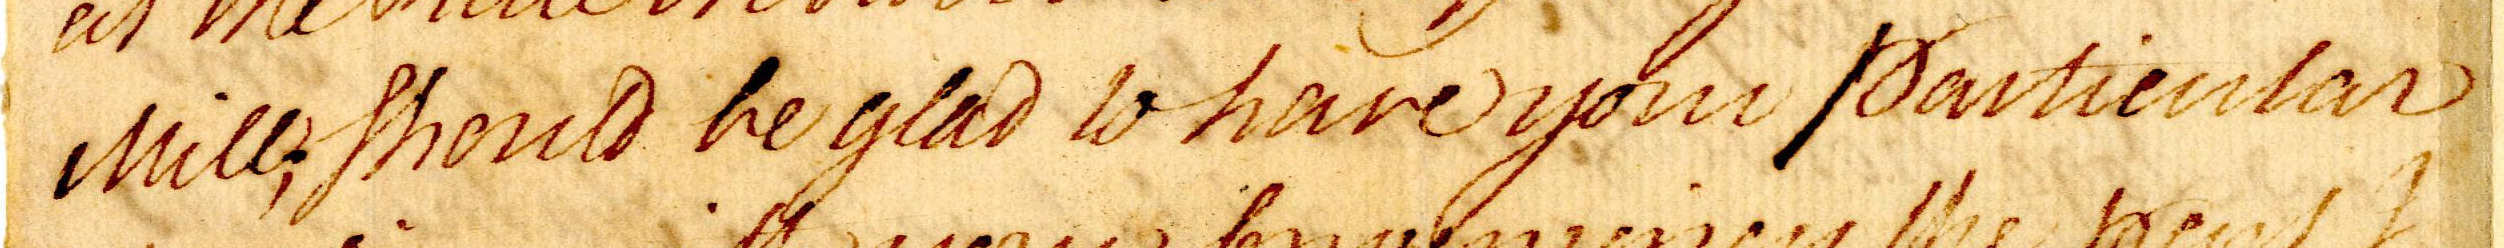Mill; should be glad to have your Particular
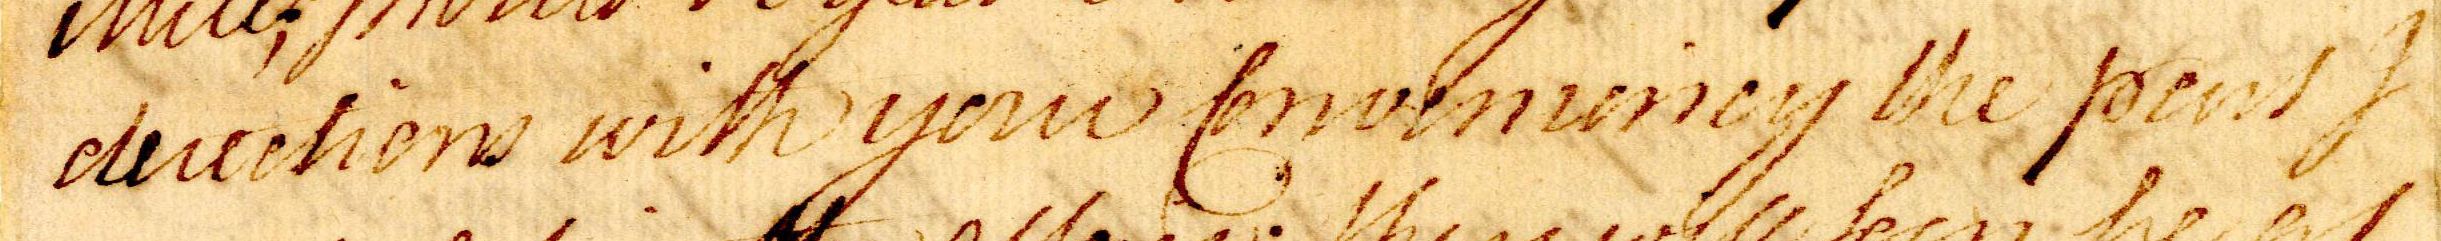directions with your Conveniency the part I
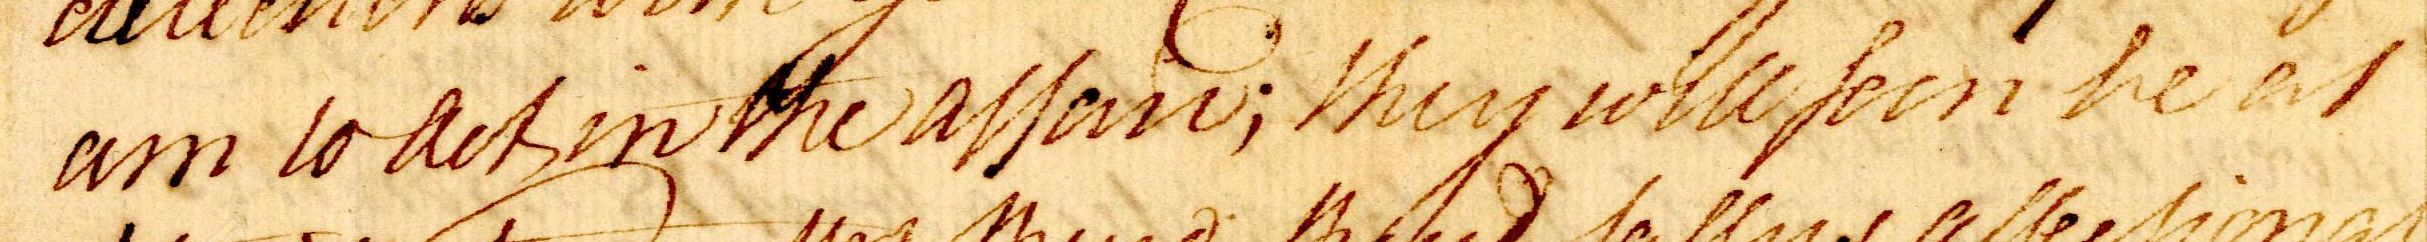am to Act in the Affair; they will soon be at
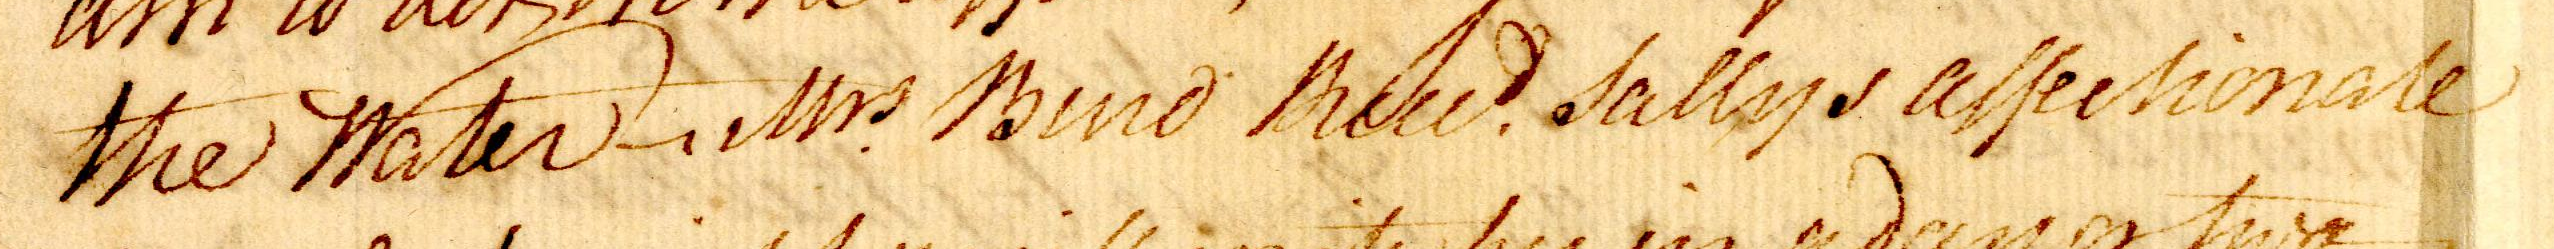the Water. M^rs Burd Rece^d. Sallys affectionate
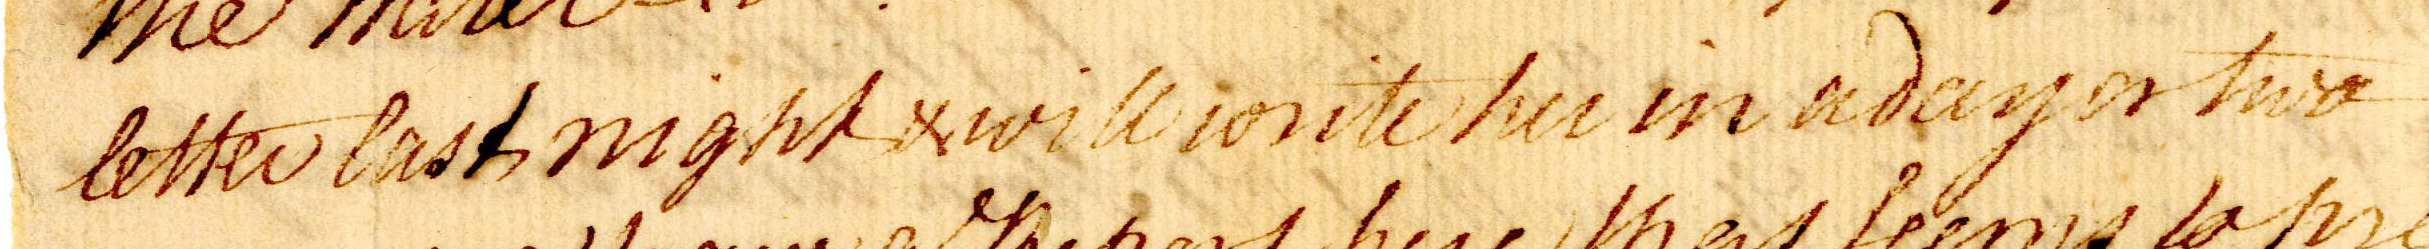letter last night & will write her in a day or two
